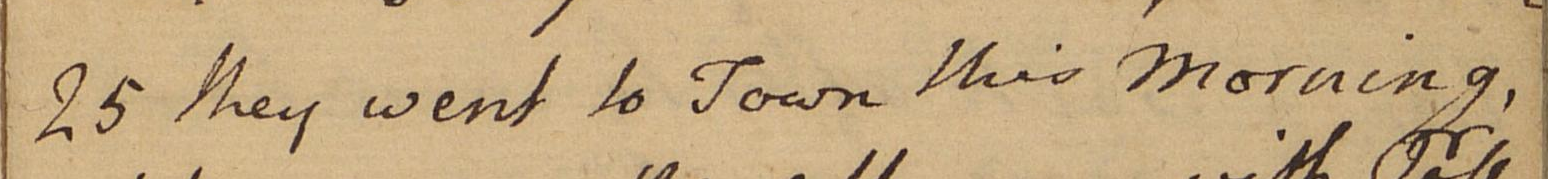25 they went to Town this Morning,
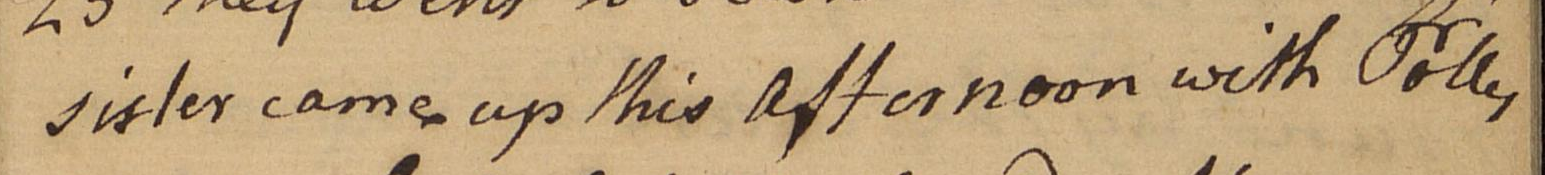sister came up this afternoon with Polly
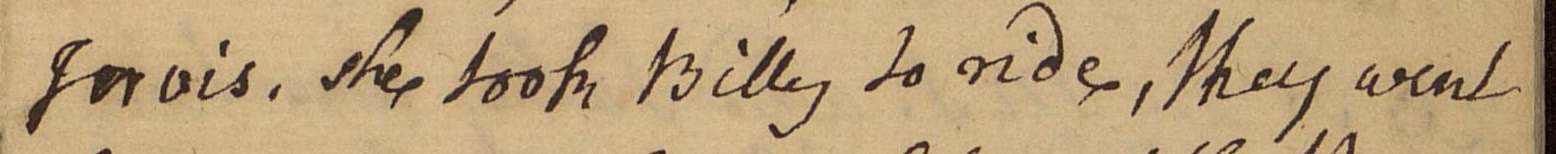Jervis. she took Billy to ride, they went
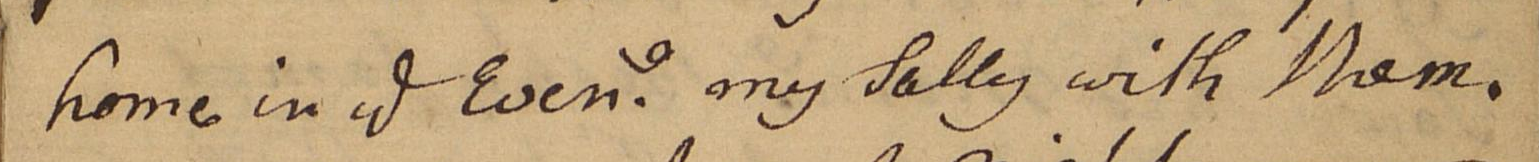home in y^e Even^g. my Sally with them.
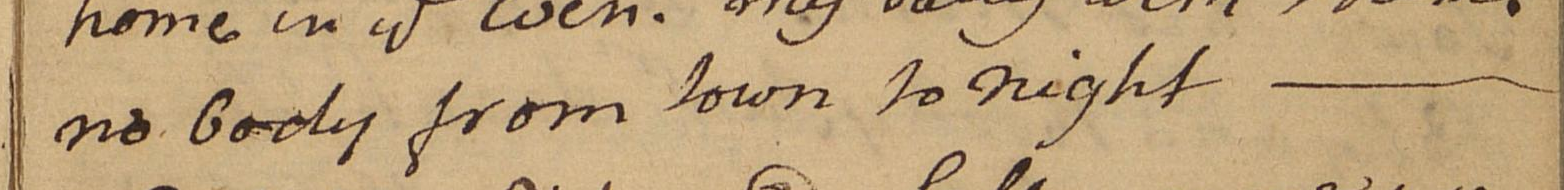no body from town to night-
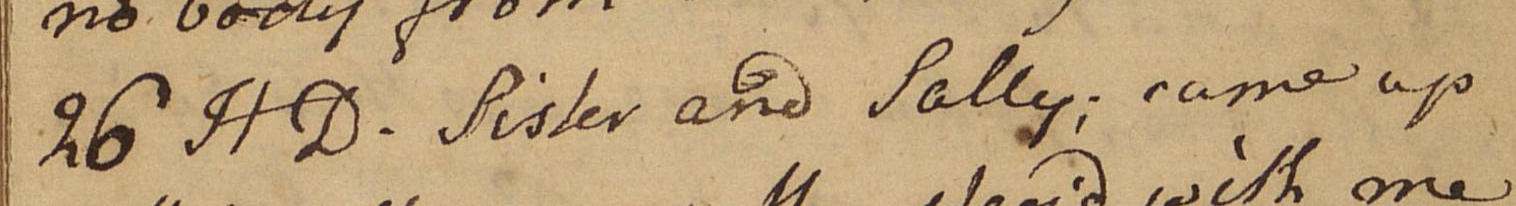26 H D. Sister and Sally; came up
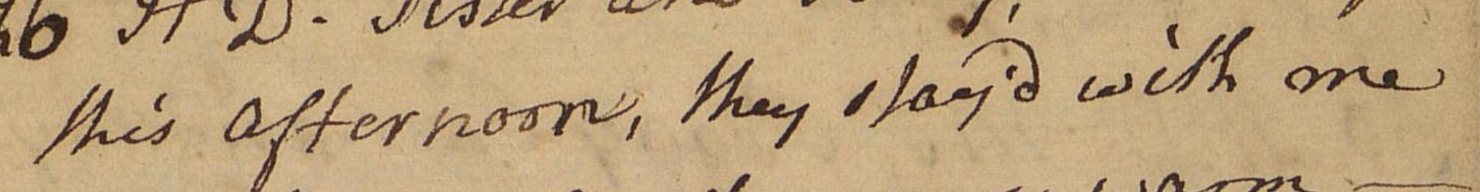this afternoon, they stay'd with me
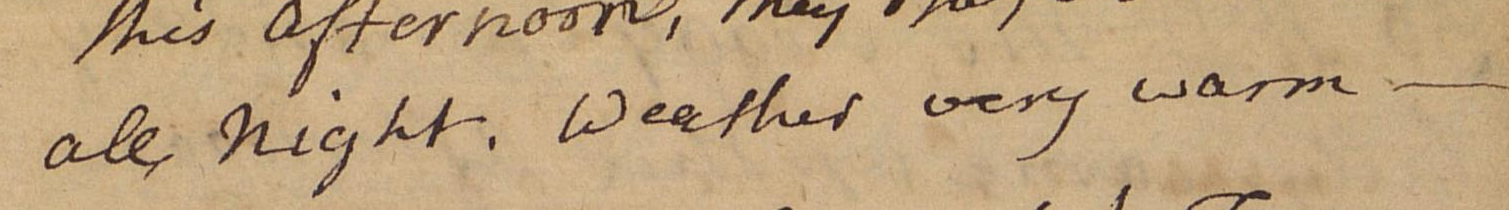all night, Weather very warm-
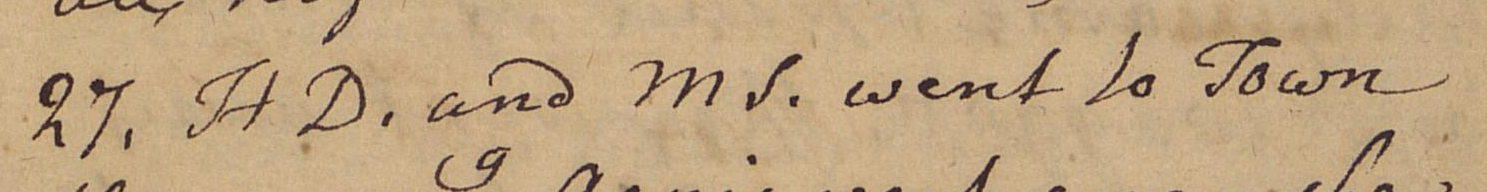27. H D. and MS. went to Town
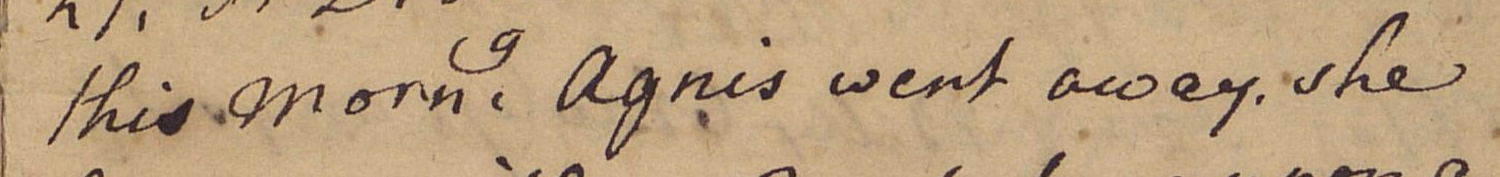this morn^g. Agnis went away. she
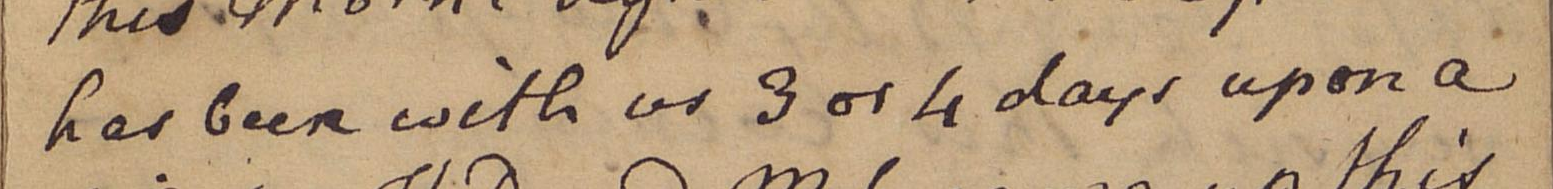has been with us 3 or 4 days upon a
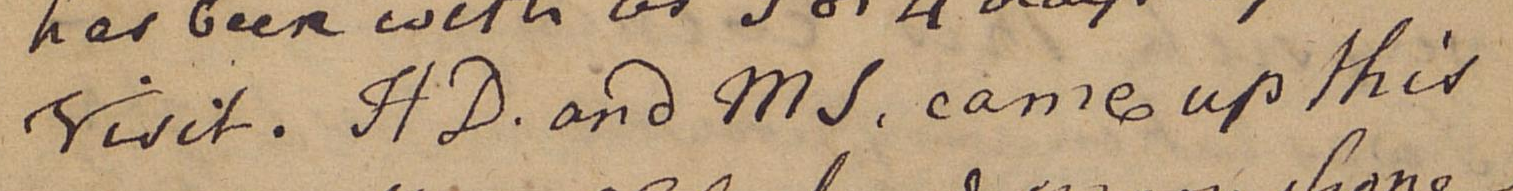Visit. H D. and MS. came up this
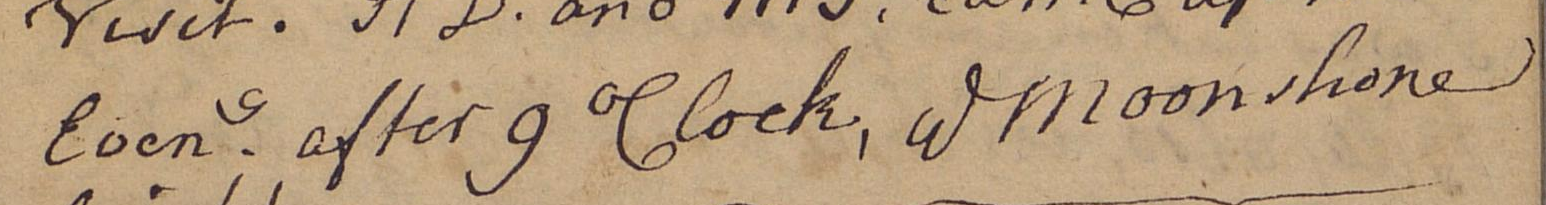Even^g. after 9 ^o Clock, y^e Moon shone
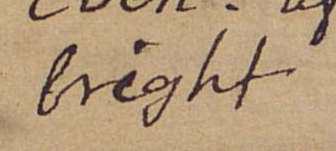bright-
